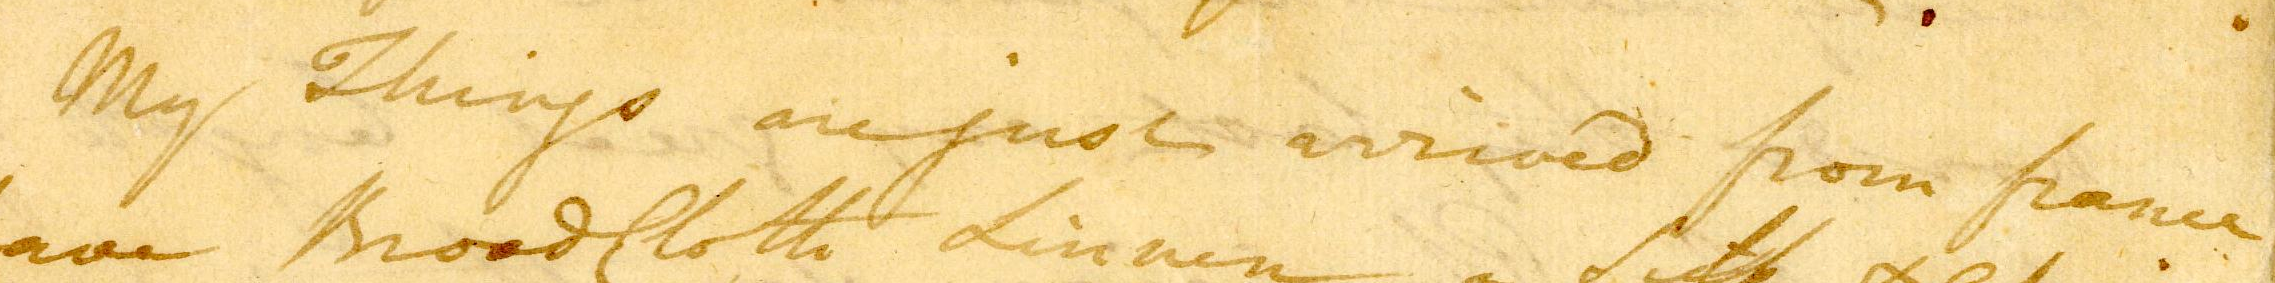My Things are just arrived from france
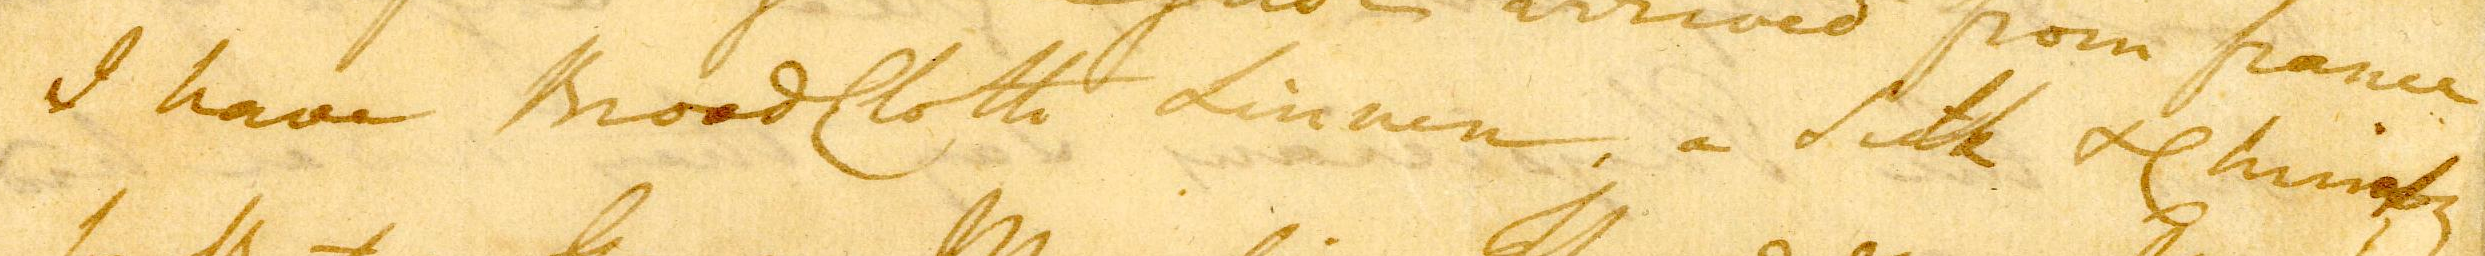I have Broad Cloth Linen a Silk & Chintz
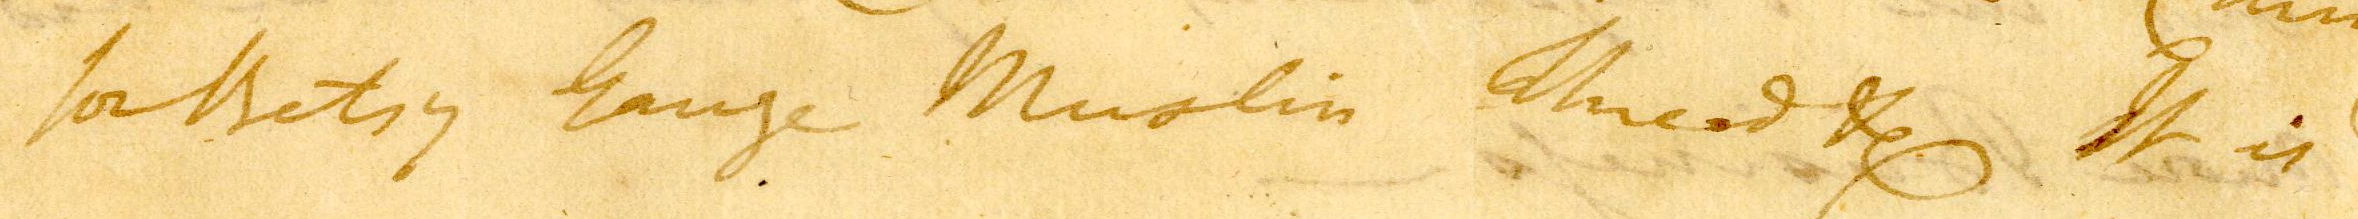for Betsy Gauge Muslin Thread &c.It is
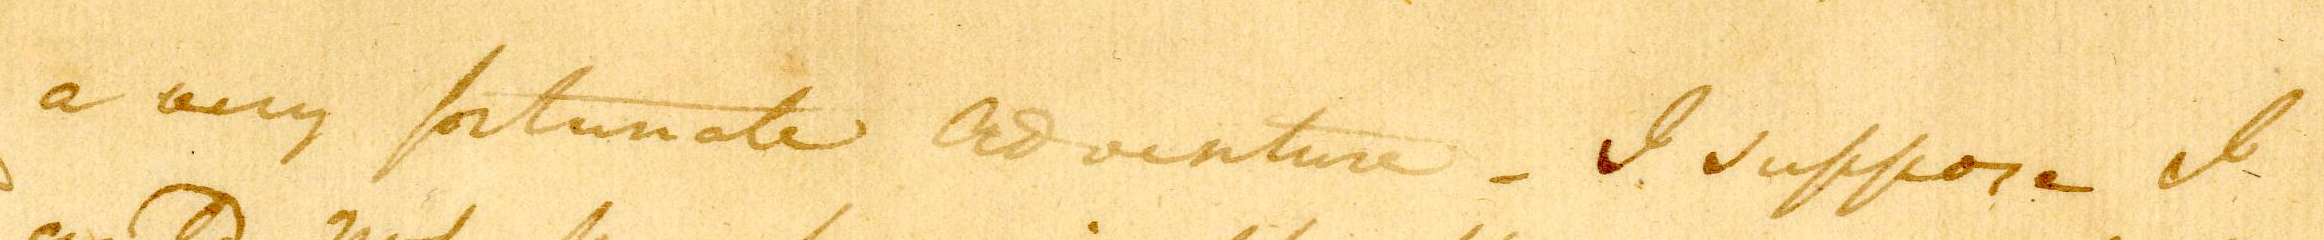a very fortunate Adventure. I suppose I
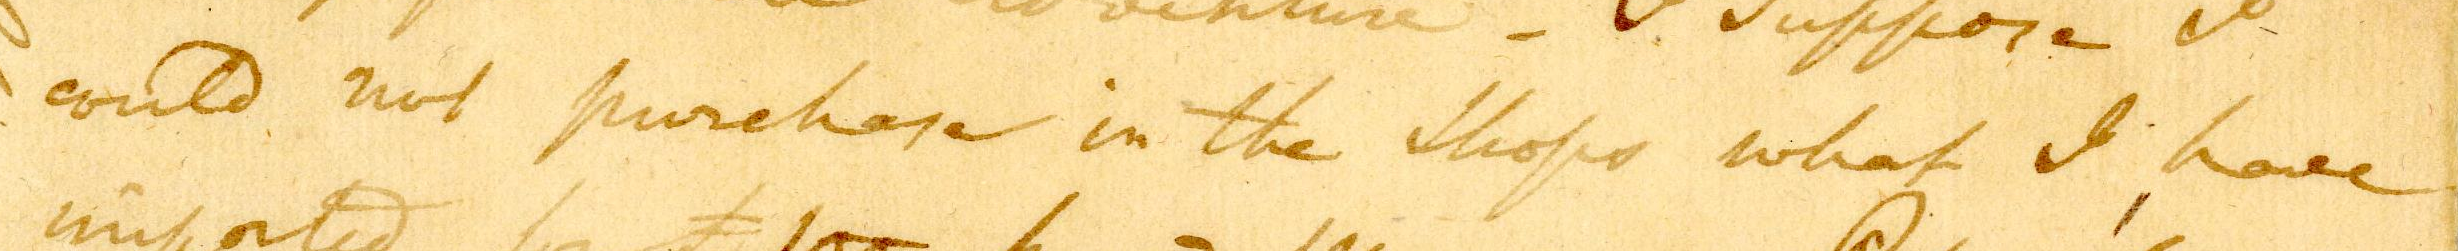could not purchase in the Shops what I have
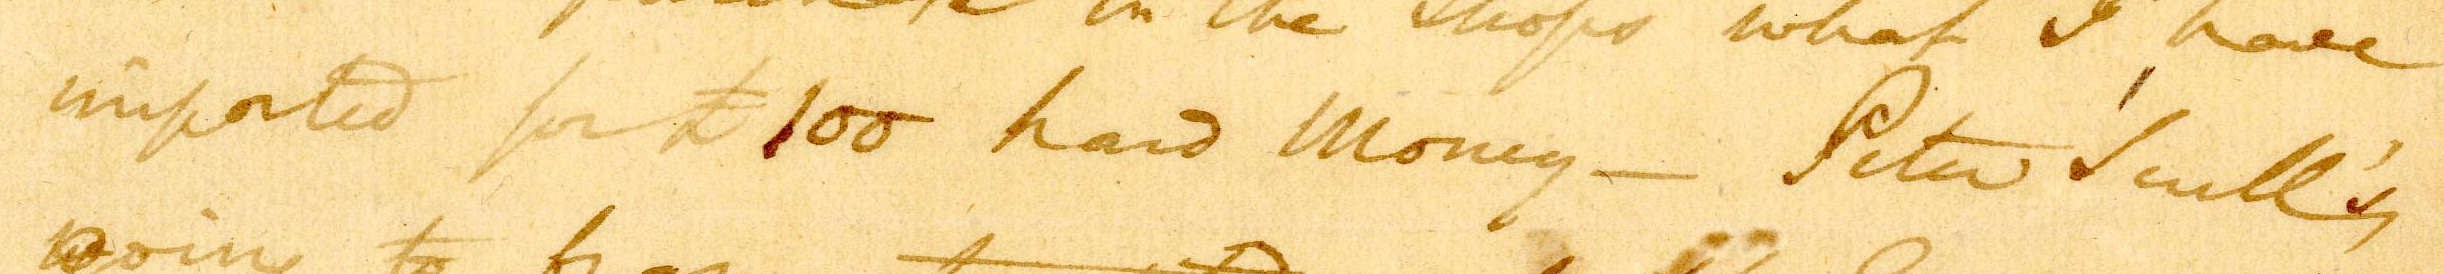imported for £100 hard Money- Peter Scull's
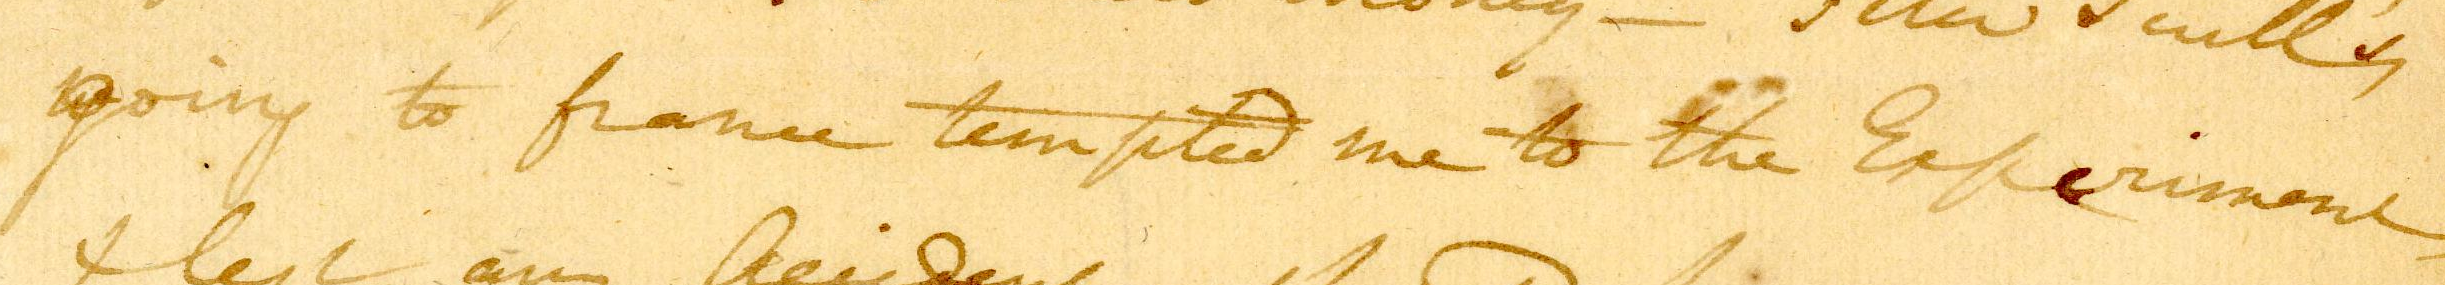going to france tempted me to the Experiment
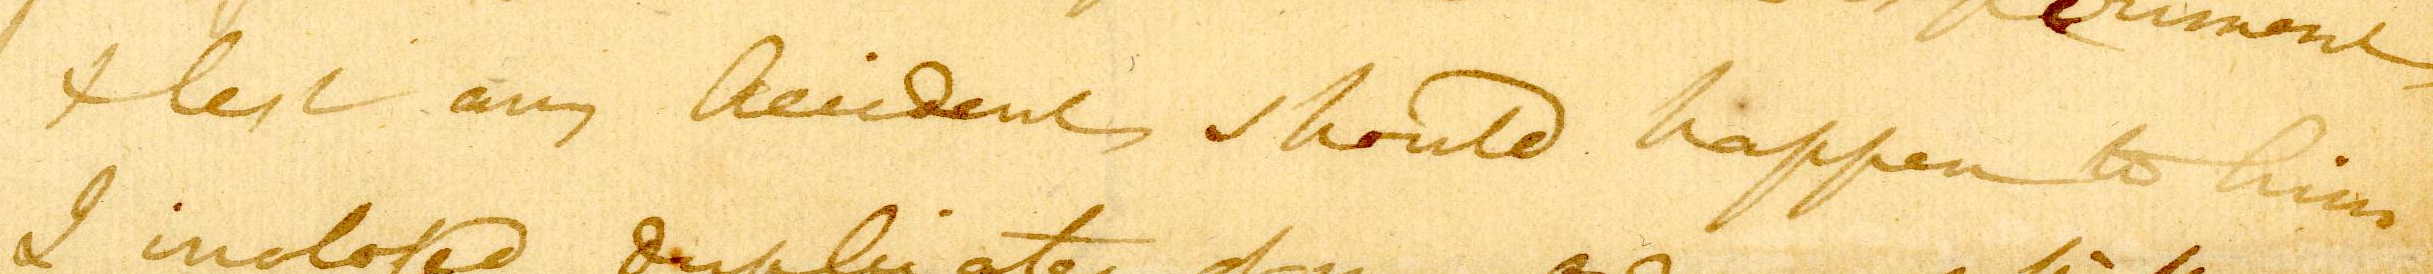& lest any Accident should happen to him
